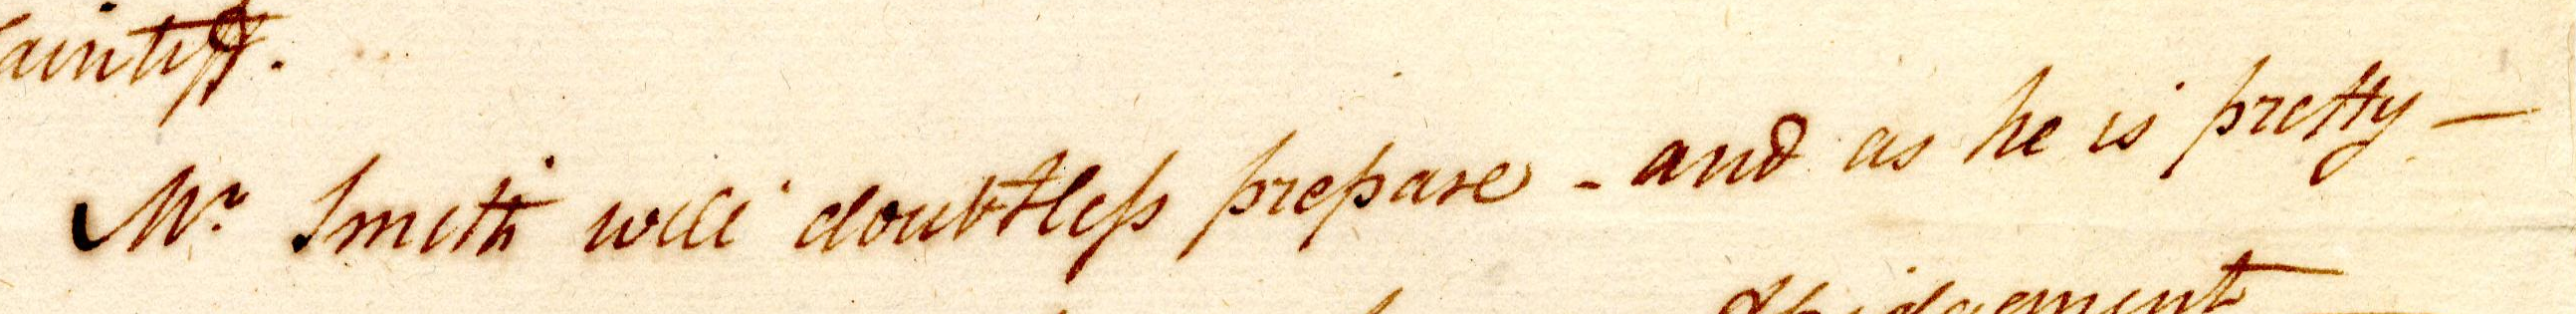M^r. Smith will doubtless prepare, and as he is pretty
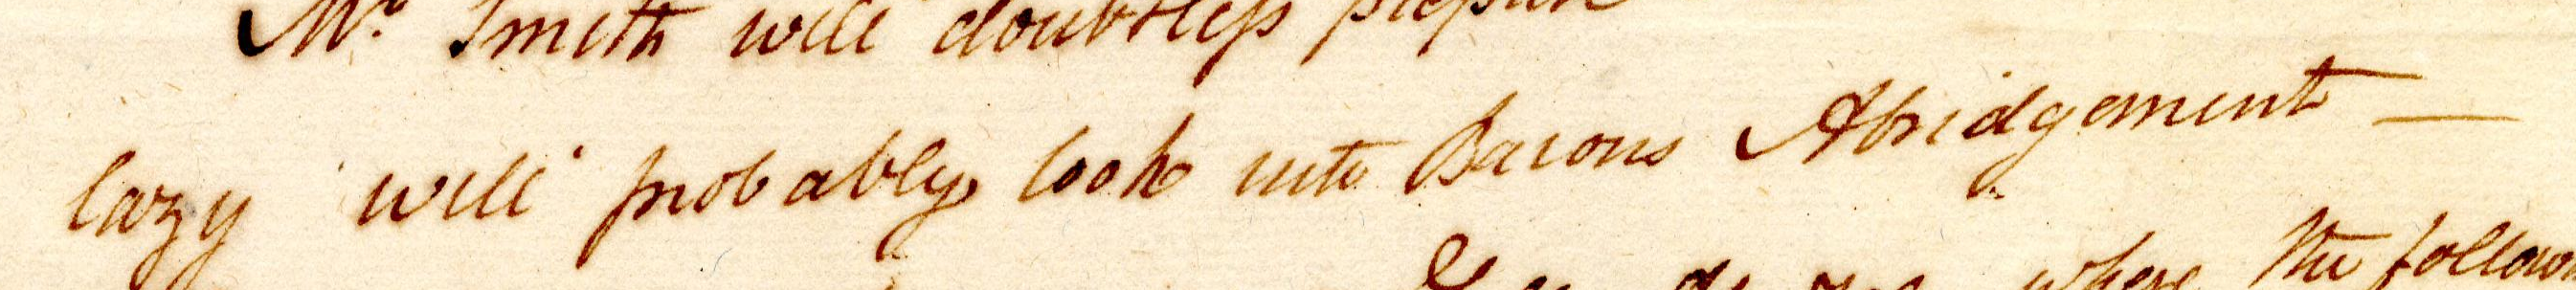lazy will probably look into Bacons Abridgement
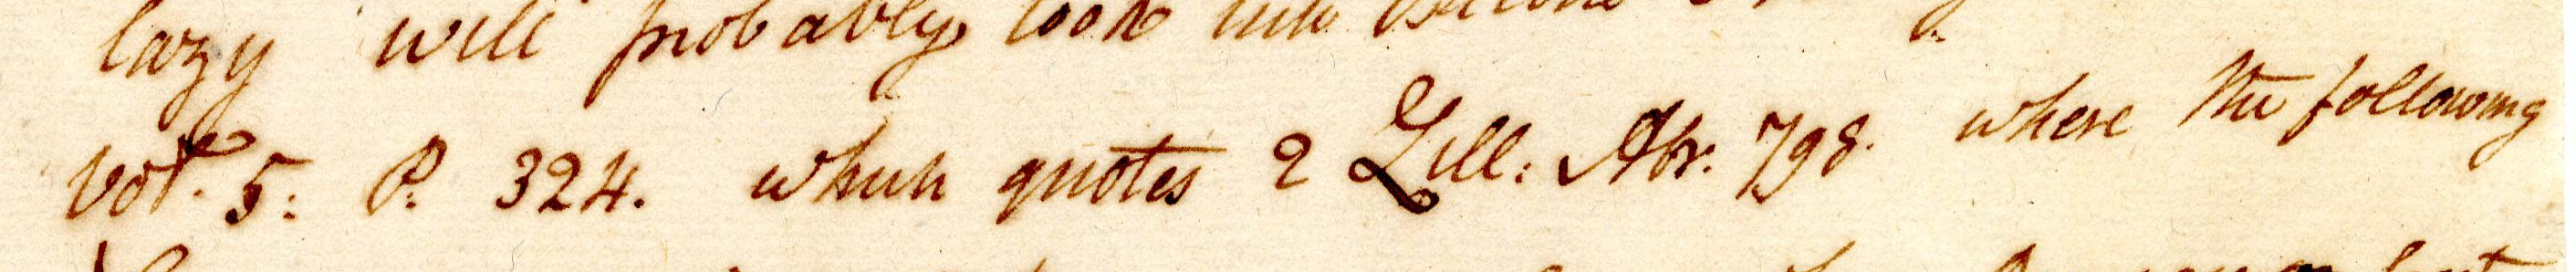Vol. 5. P. 324. which quotes 2 Lill. Abr. 798. where the following
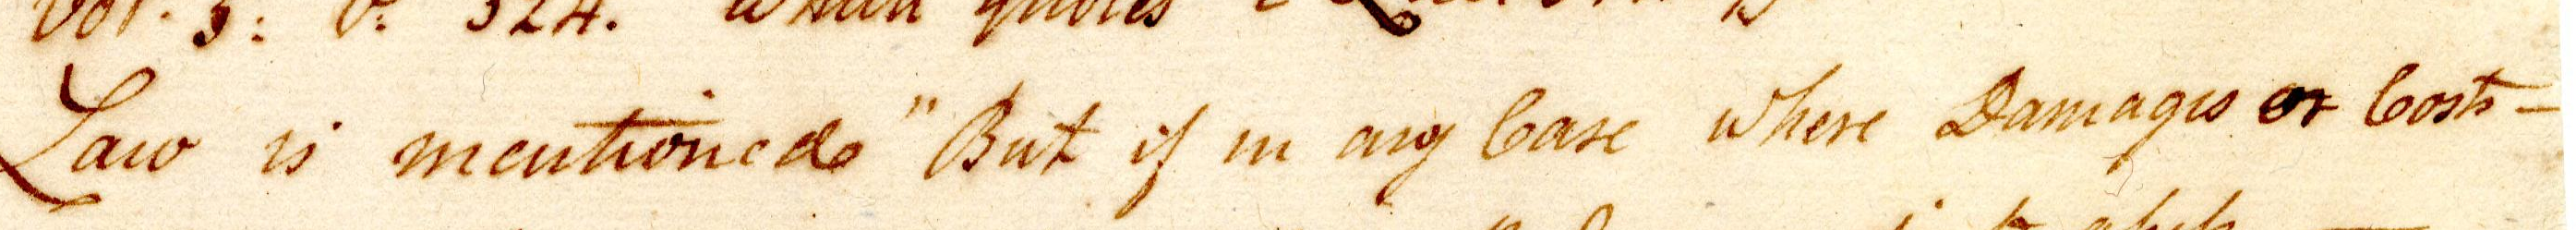Law is mentioned "But if in any Case where Damages or Costs
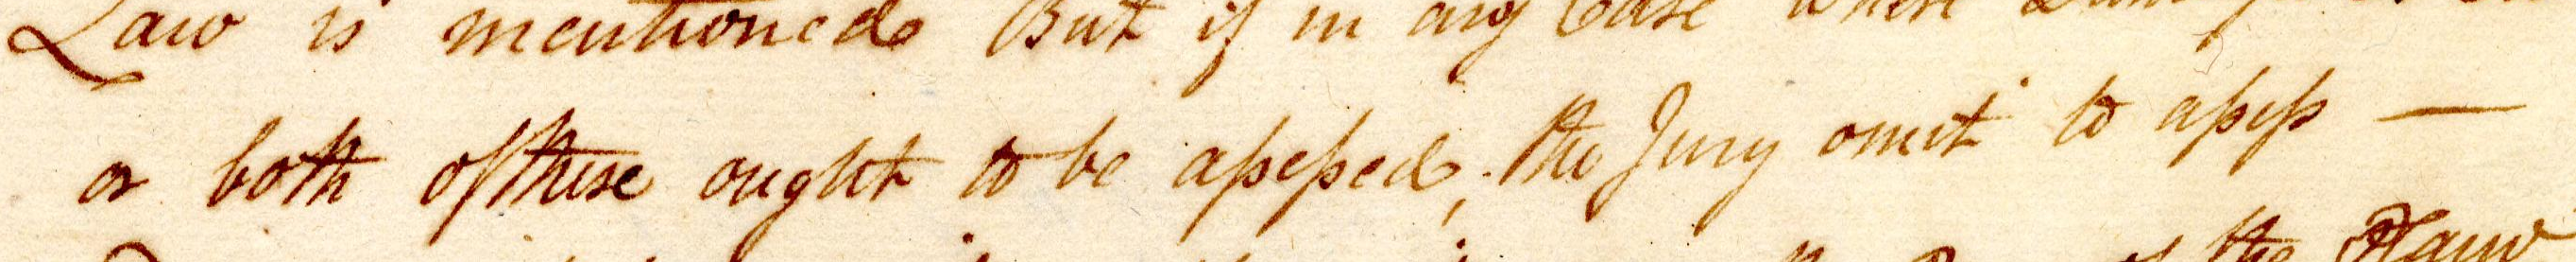or both of these ought to be assessed. the Jury omit to assess
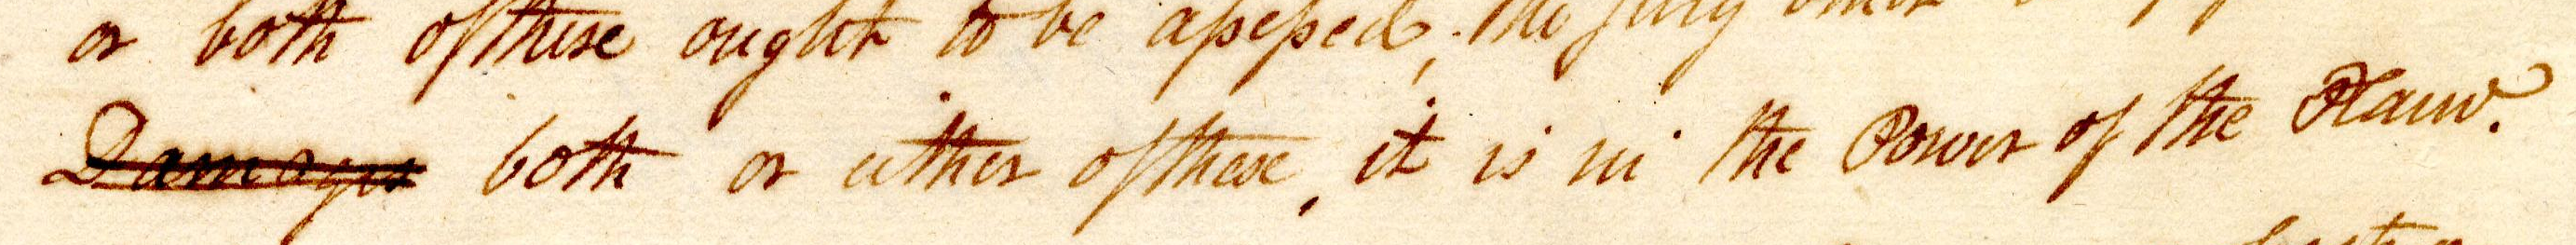Damages both or either of these it is in the Power of the Plaw^e.
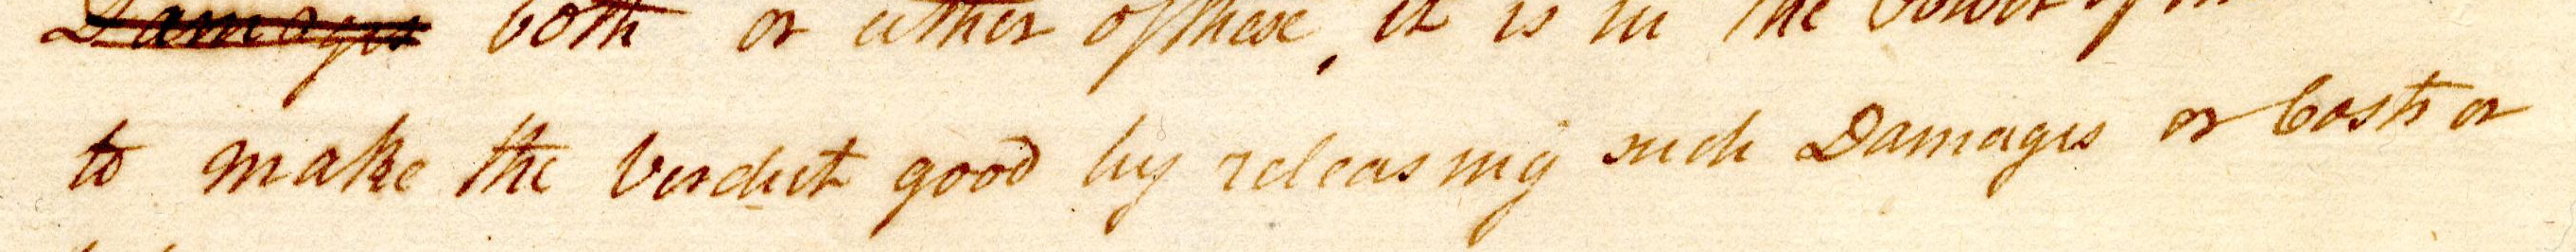to make the verdict good by releasing such Damages or Costs or
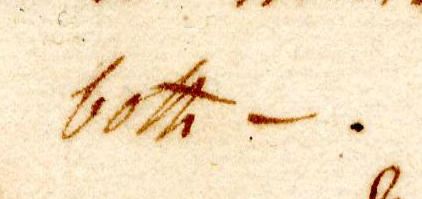both.
